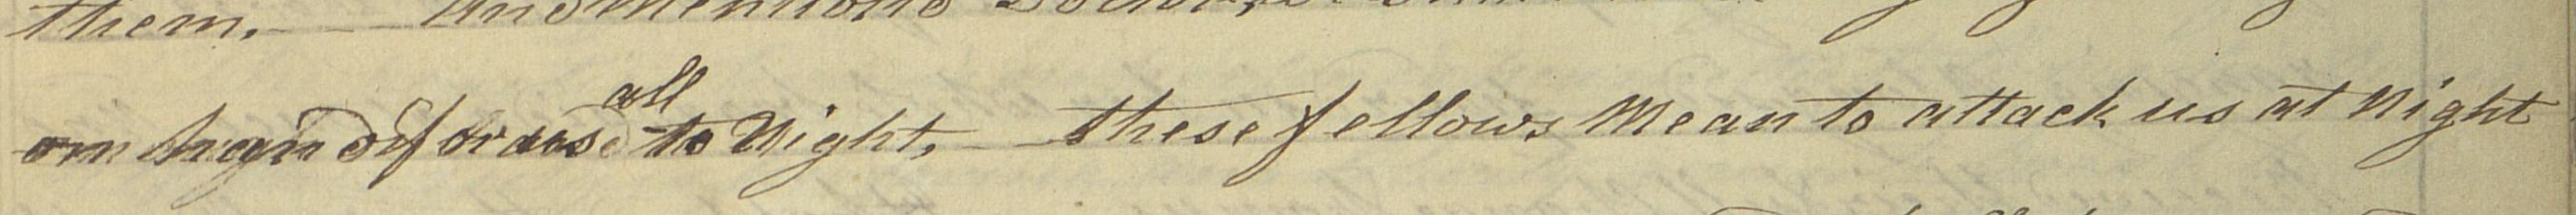on hand of or us ^ to night, these fellows Mean to attack us at Night
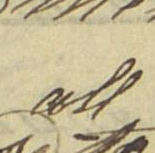all
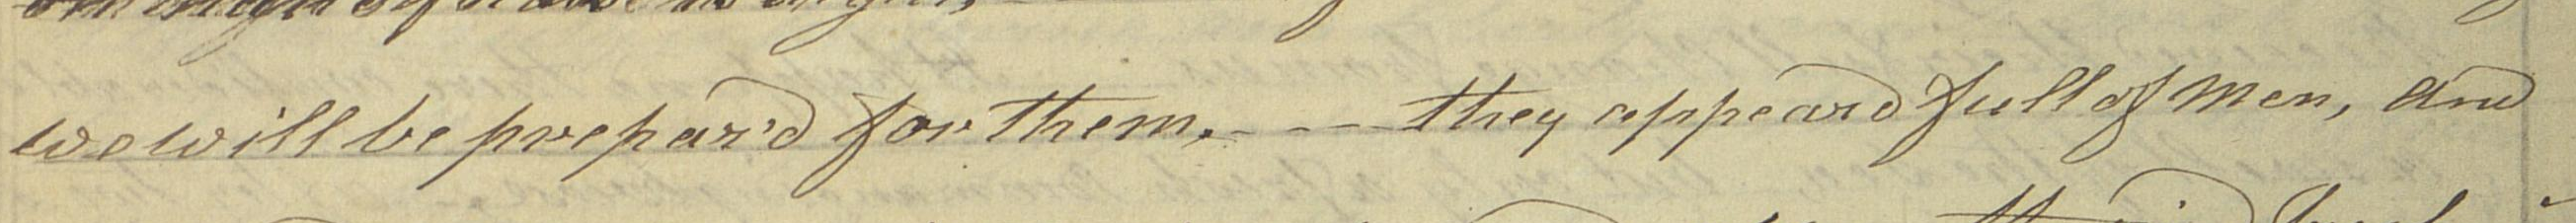We will be prepard for them. they appeared full of Men, And
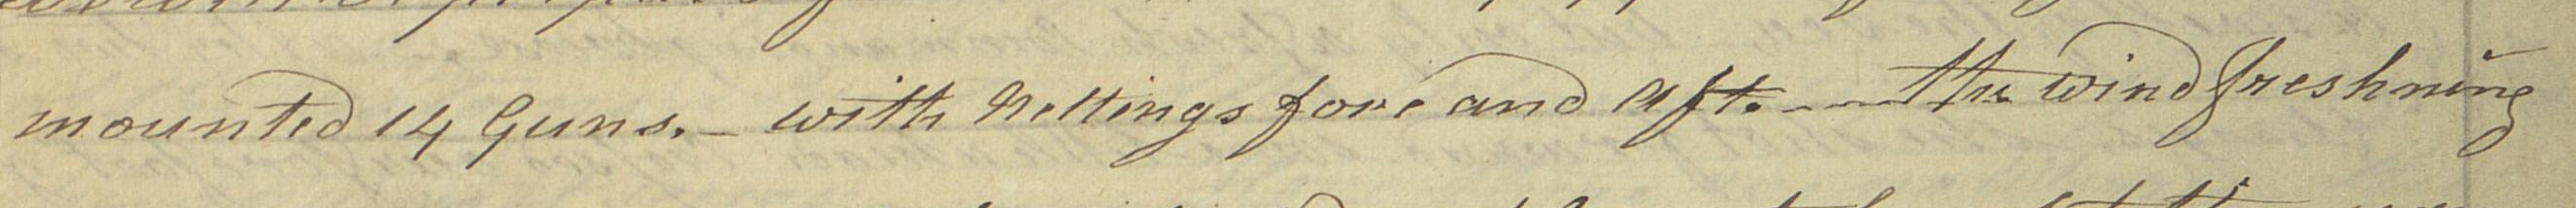mounted 14 Guns. with Nettings fore and aft. the wind freshning
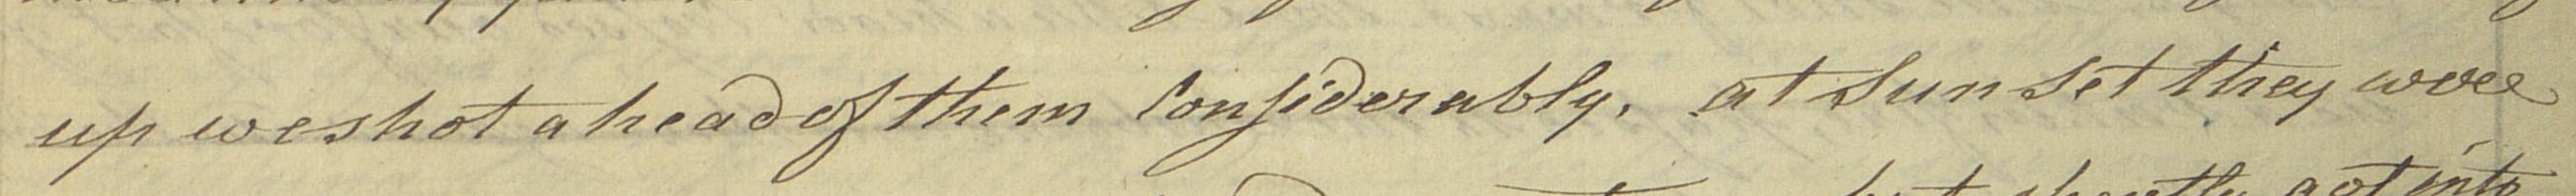up we shot ahead of them Considerably. at sun set they were
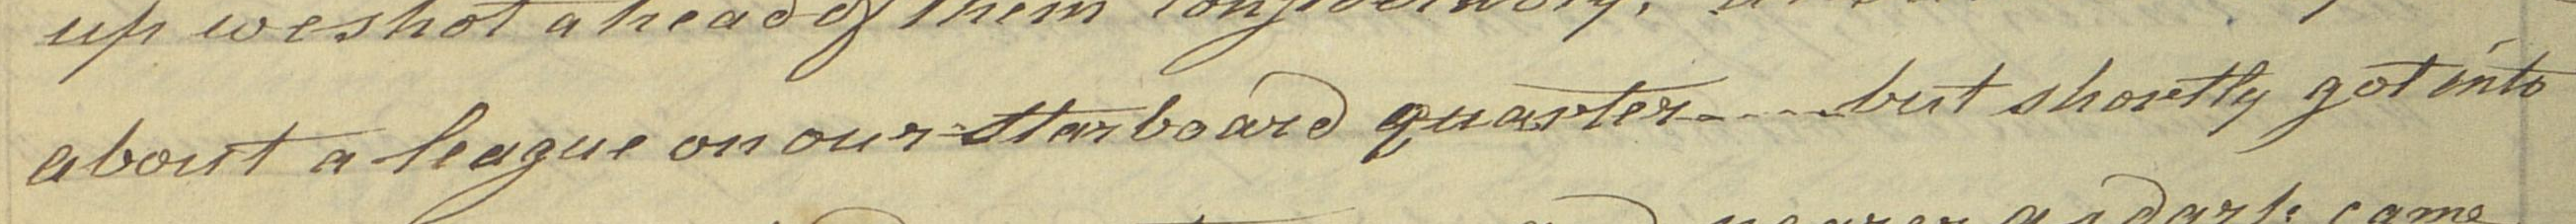about a league on our starboard quarter, but shortly got into
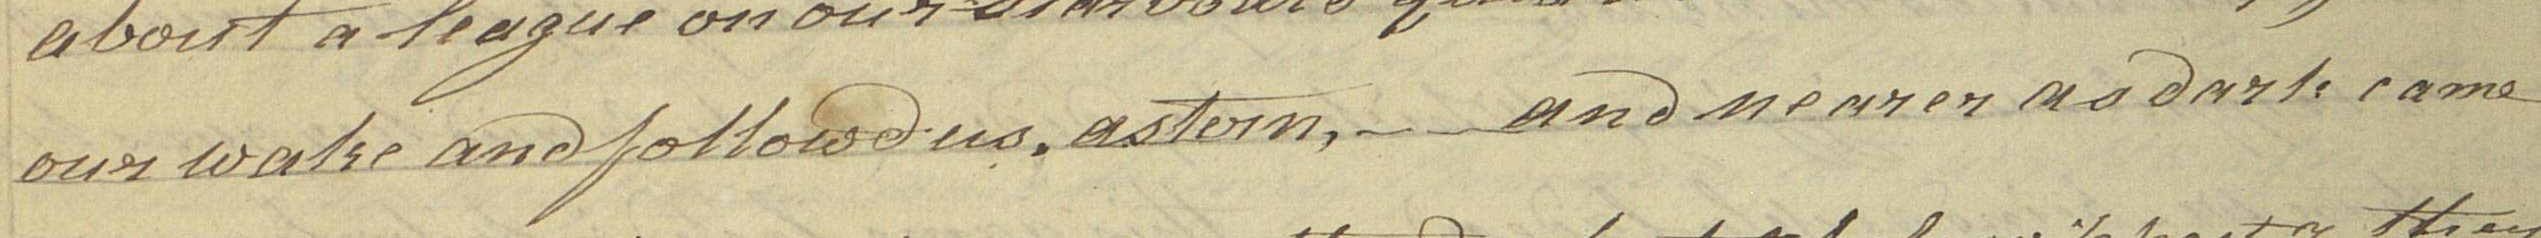our wake and followd us, astern, and nearer as dark came
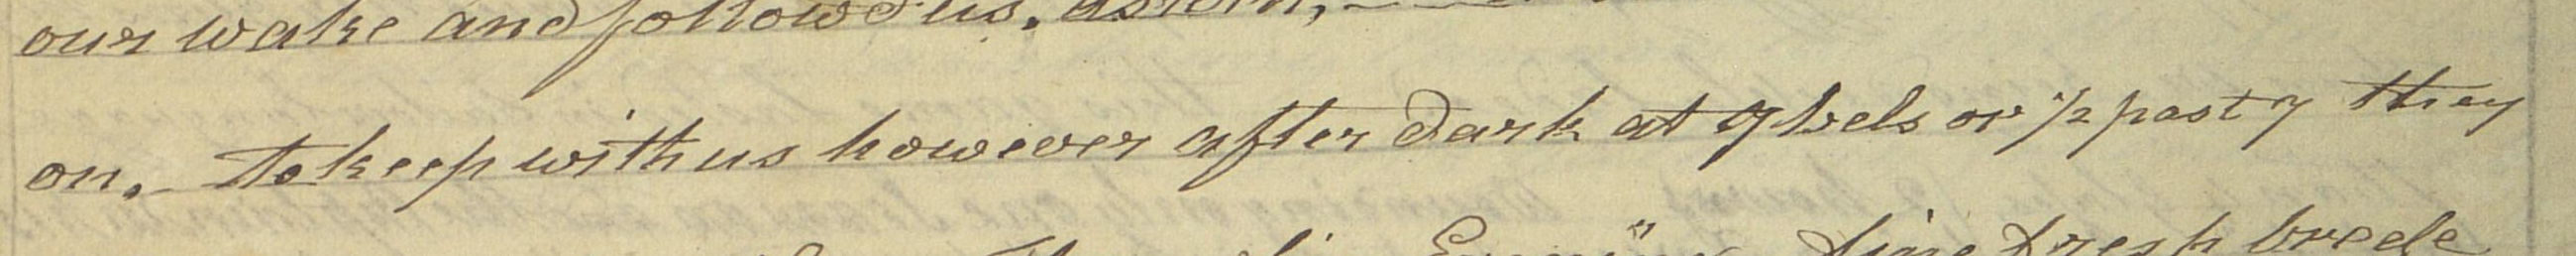on. to keep with us however after dark at 7 bels or 1/2 past^y they
